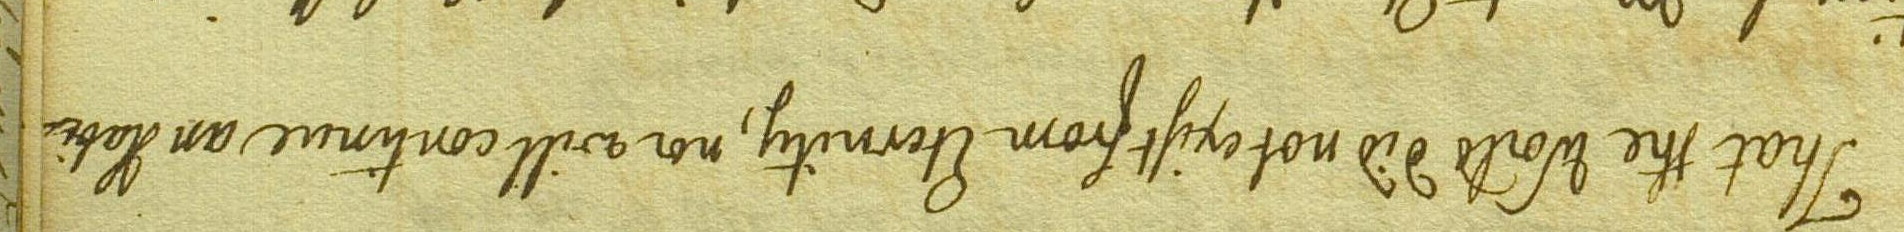That the World did not exist from Eternity, nor will continue an Habi-
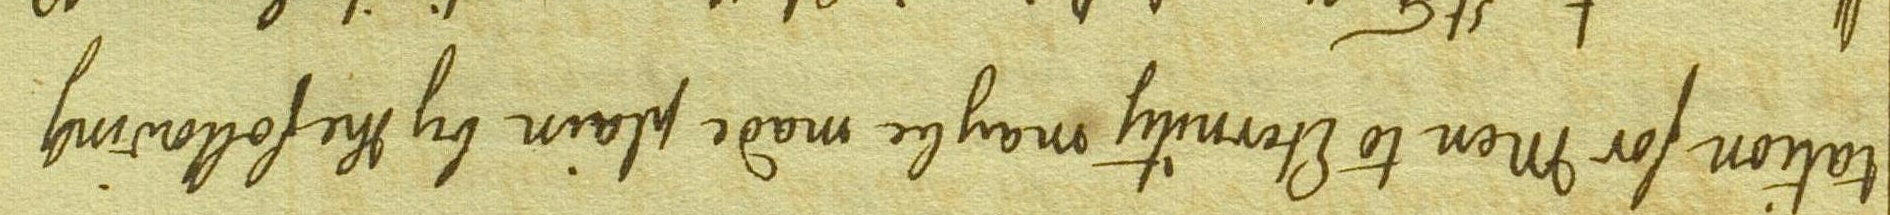tation for Men to Eternity maybe made plain by the following
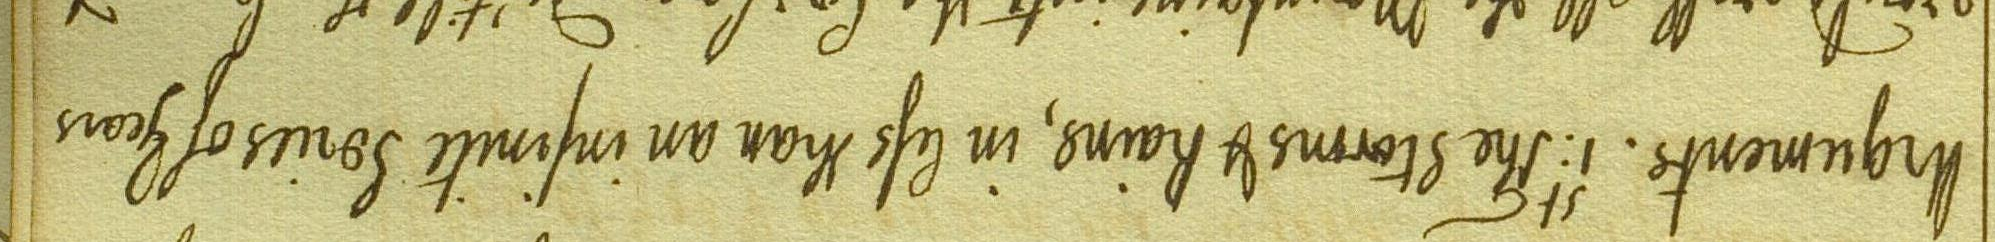Arguments. 1^st. The storms & Rains, in less than an infinite Series of Years
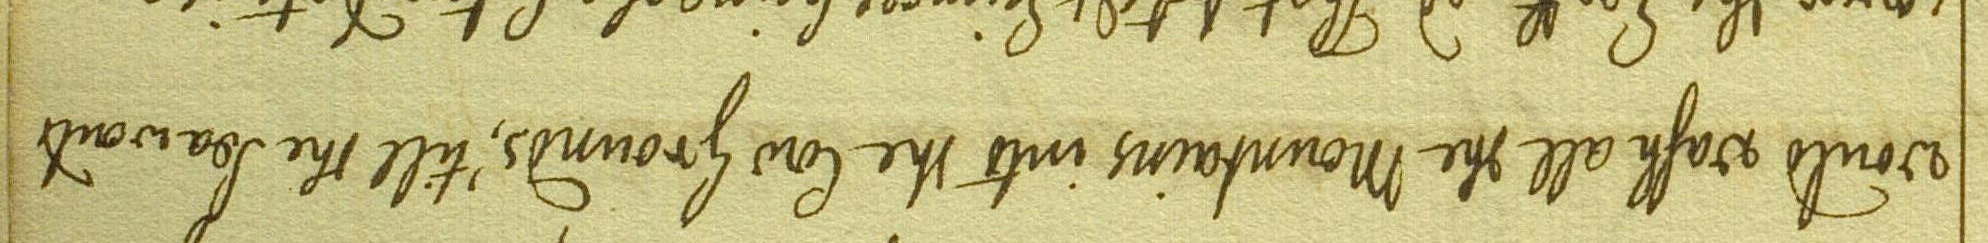would wash all the mountains into the low Grounds, till the Sea would
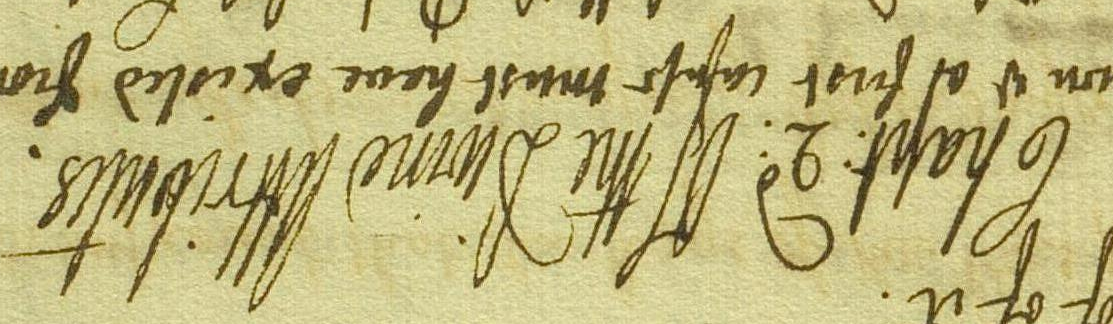Chapt. 2^d. Of the Divine Attributes.
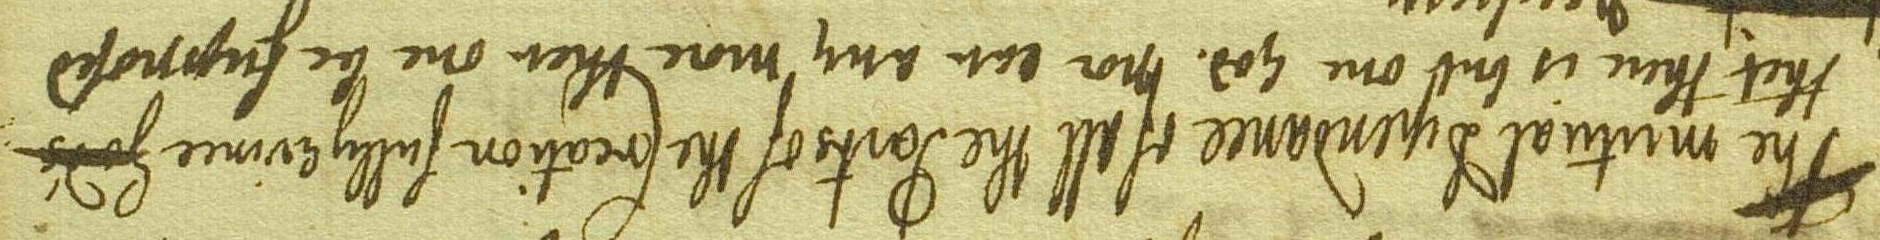The mutual Dependance of all the Parts of the Creation fully evince God's
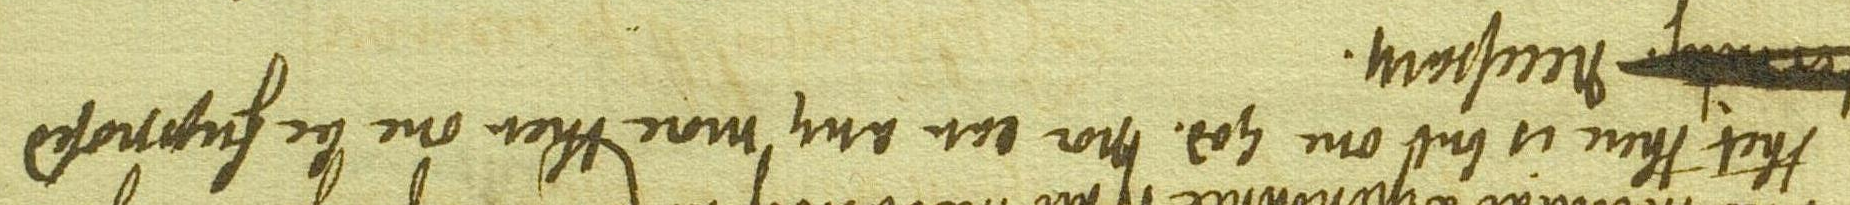that there is but one God. Nor can any more then one be supposed
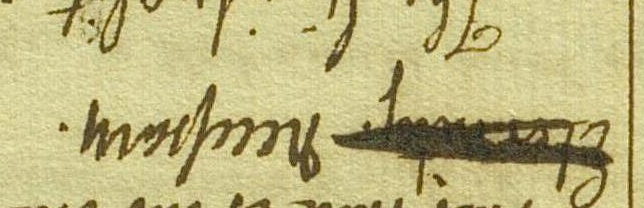[Eternity] necessary.
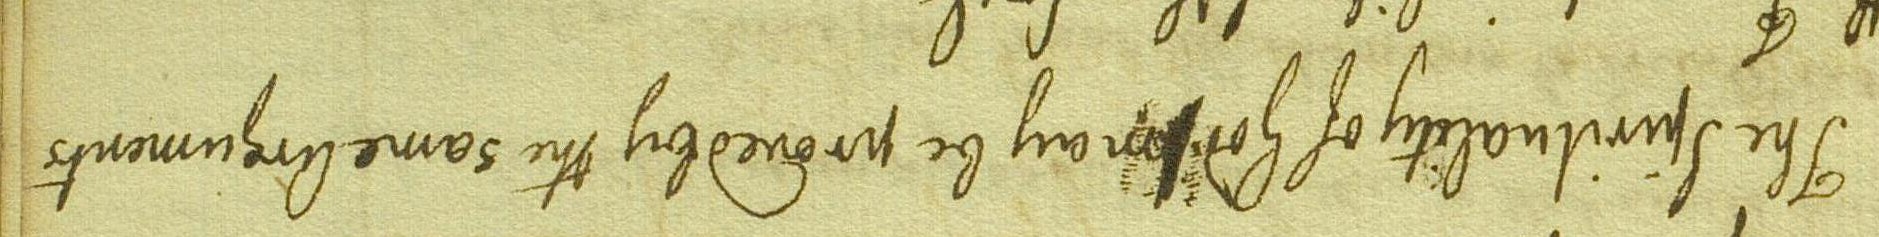The Spirituality of God may be proved by the same Arguments
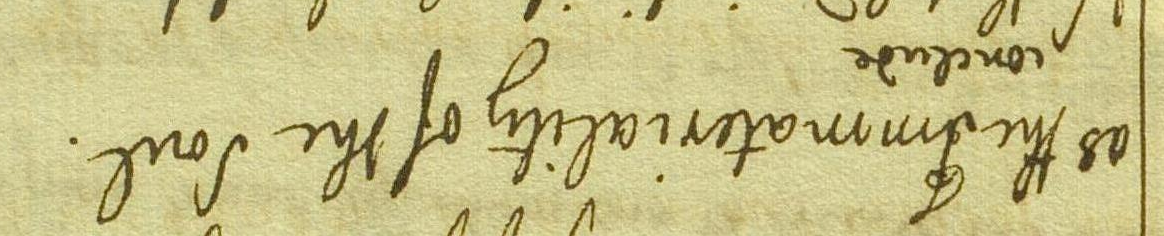as the Immatriality of the Soul.
